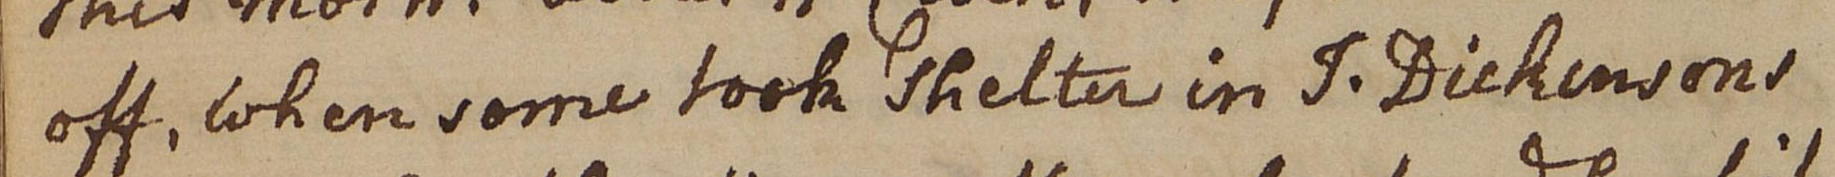off, when some took shelter in F. Dickensons
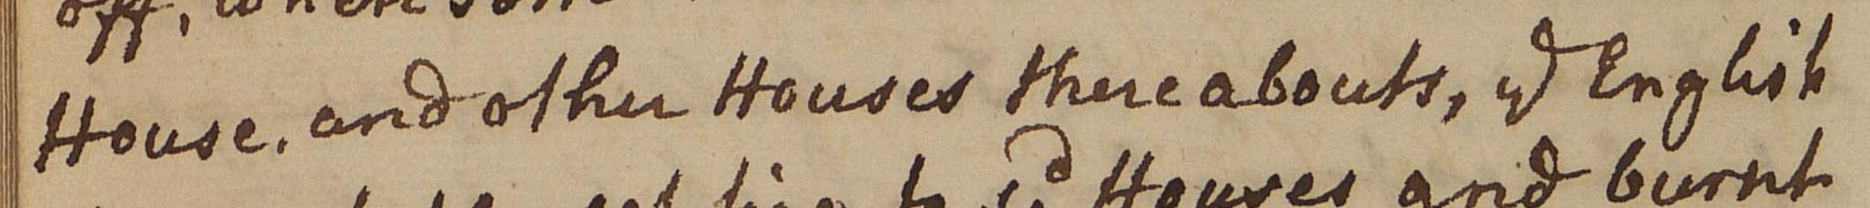House, and other Houses thereabouts, y^e English
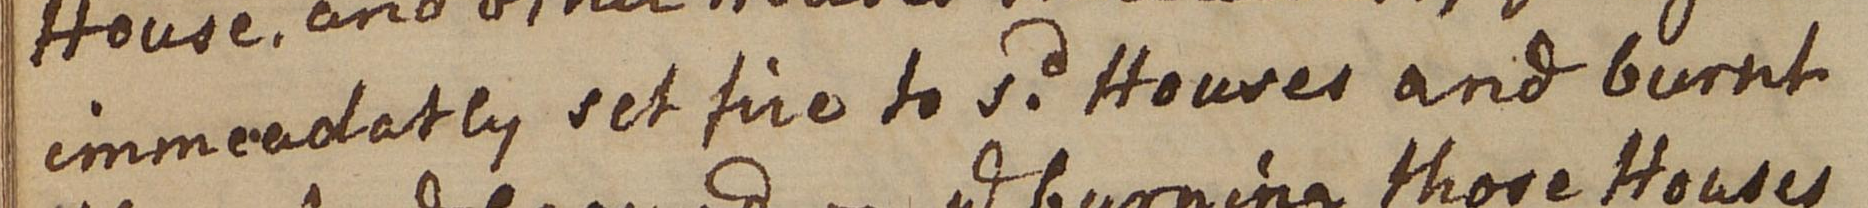immeadatly set fire to s^d. Houses and burnt
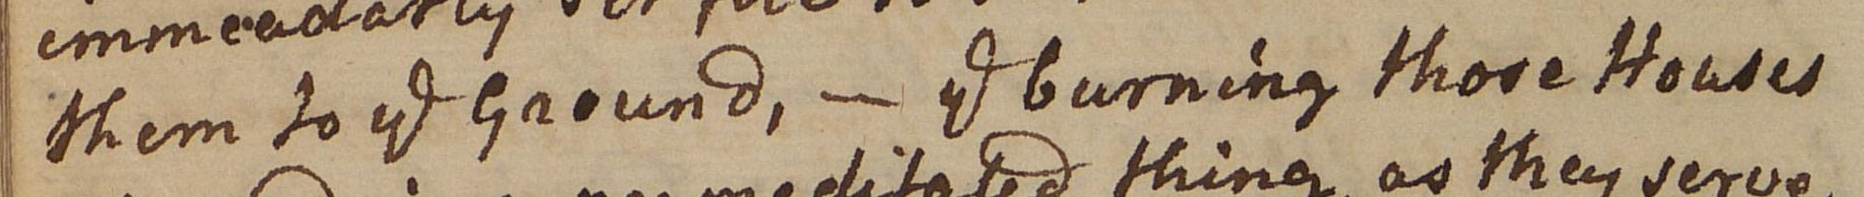them to y^e Ground,- y^e burning those Houses
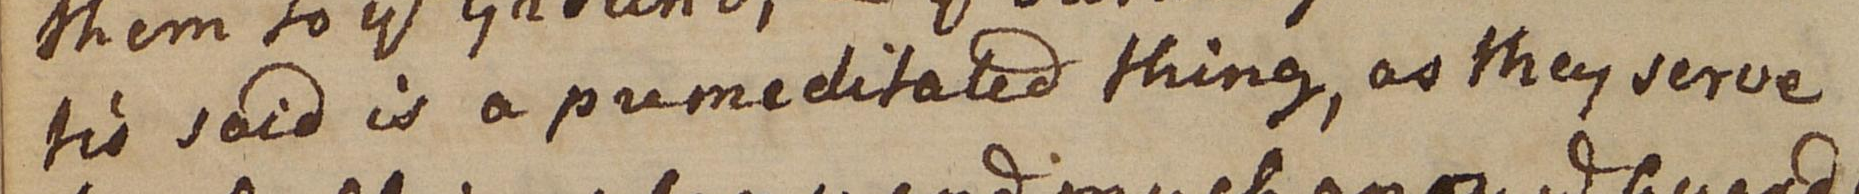tis said is a premeditated thing, as they serve
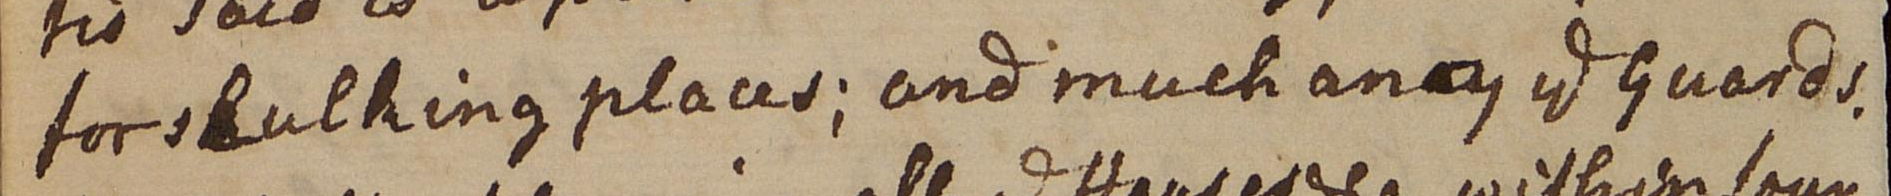for skulking places; and much anoy? y^e Guards.
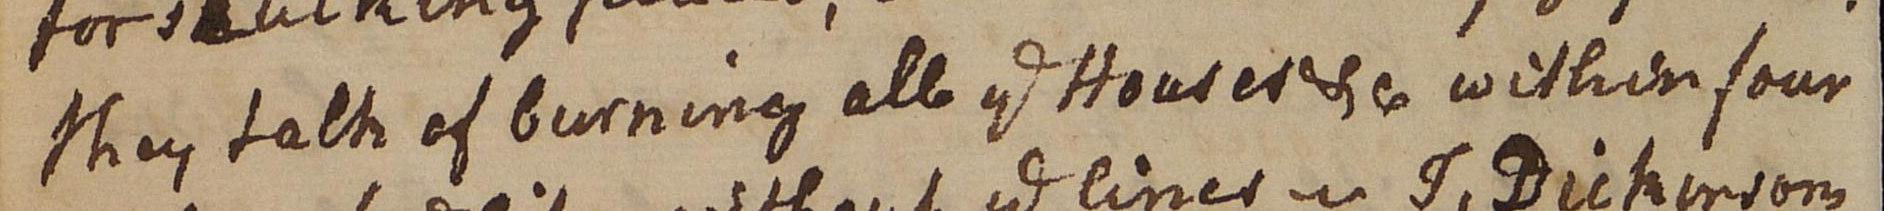they talk of burning all y^e Houses &c with in four
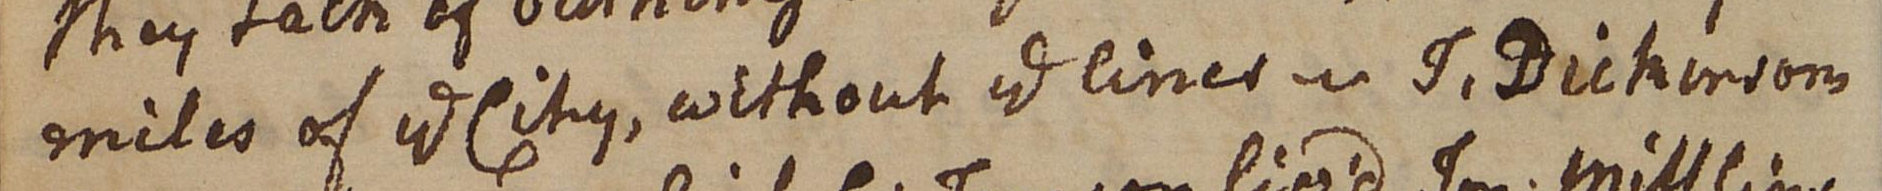miles of y^e City, without y^e lines - S. Dickensons
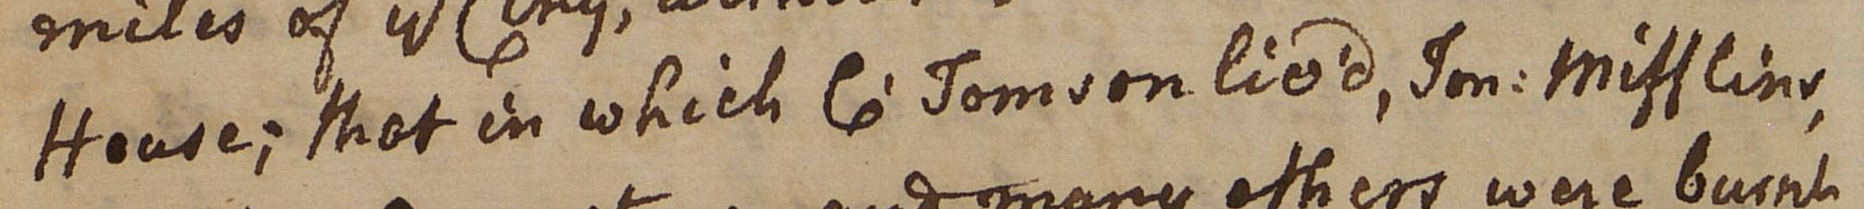House; that in which C. Tomson liv'd, Tm: Mifflins,
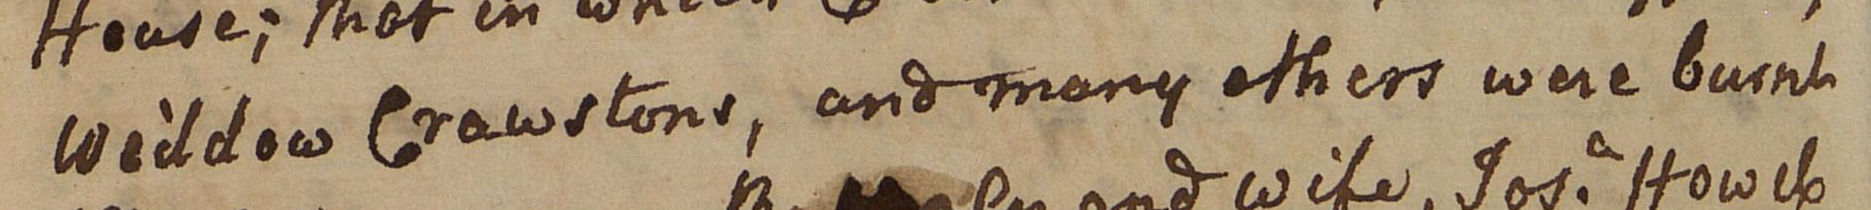Widdow Crawstons, and many others were burnt
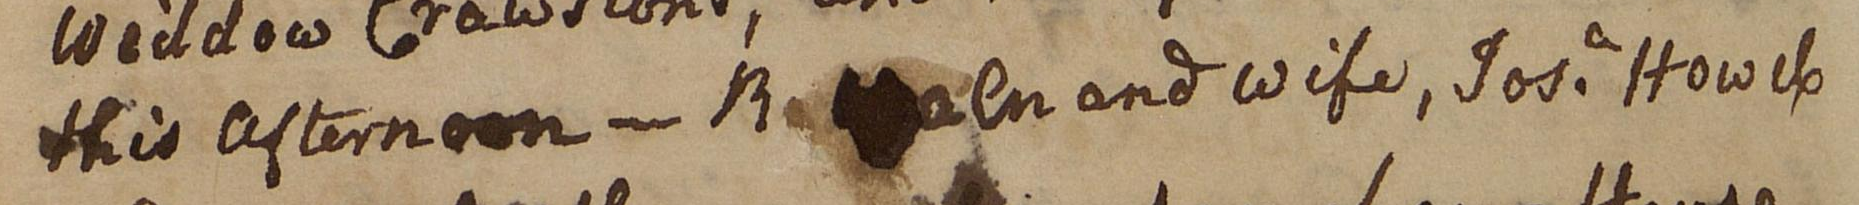this Afternoon- R [W]aln and Wife, Jos^a. Howel
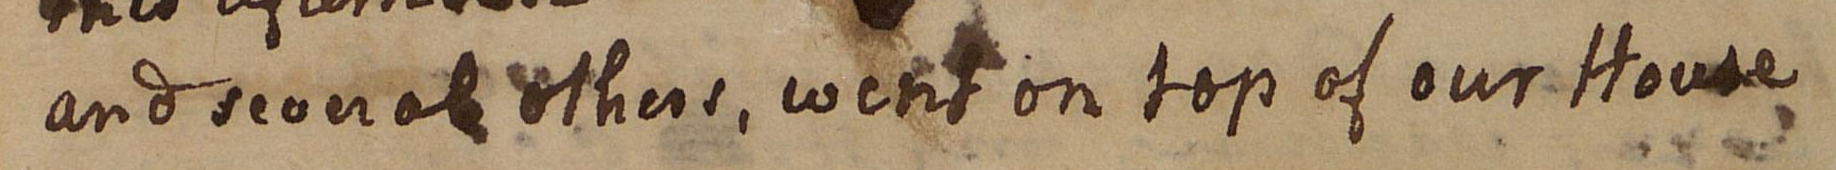and several others, went on top of our House
